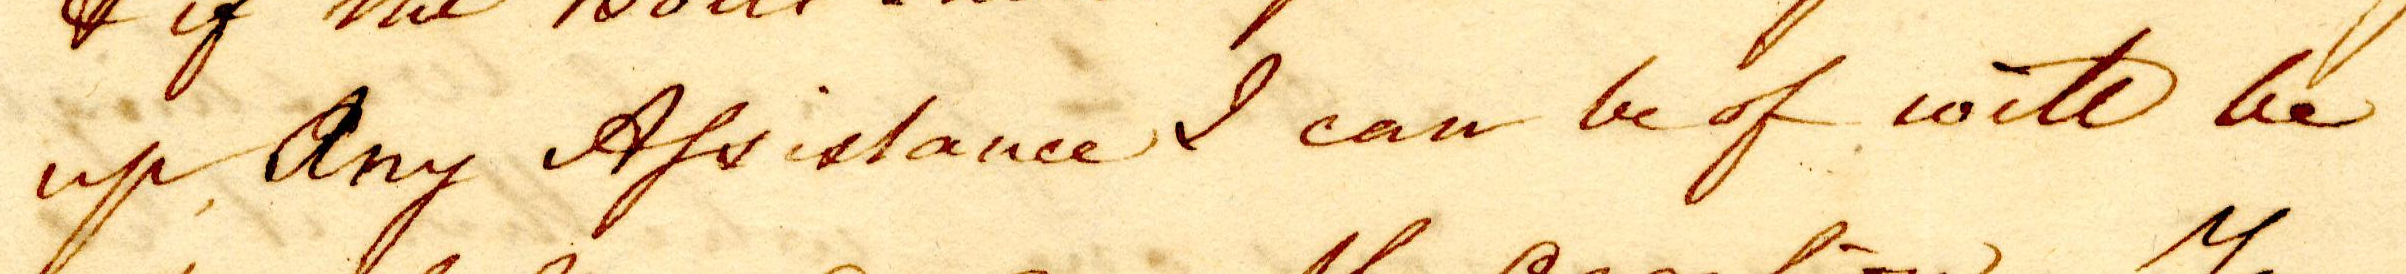up. Any Assistance I can be of will be
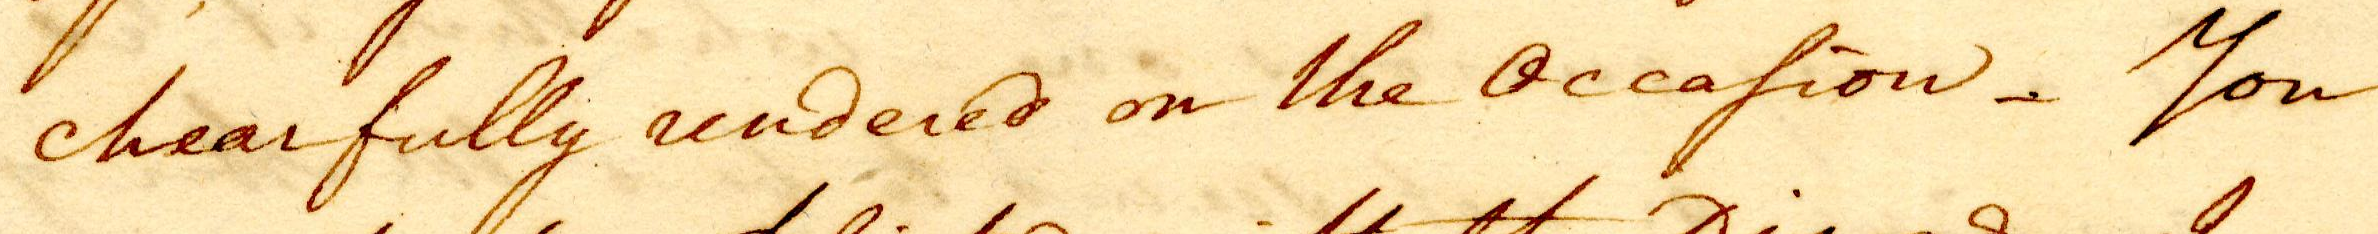chear fully rendered on Occasion. You
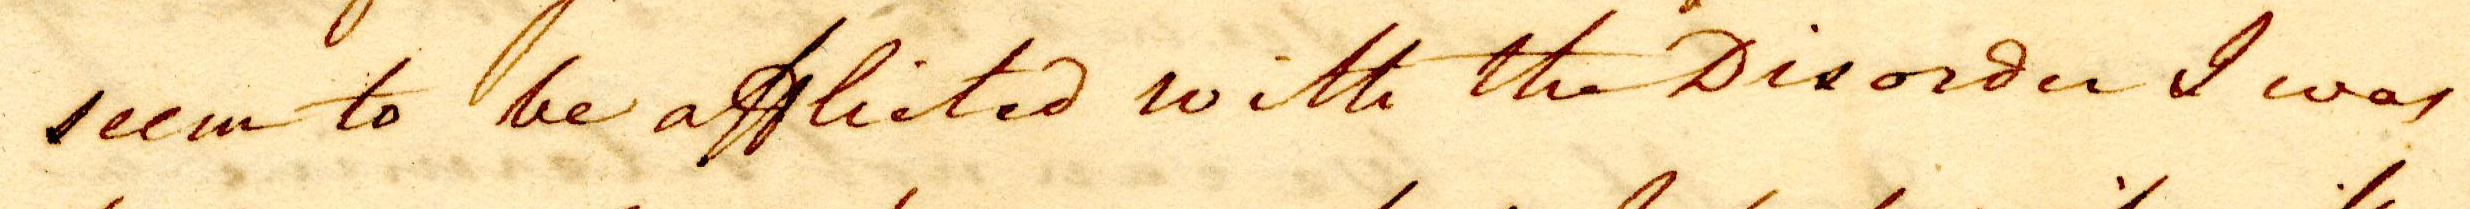seem to be afflicted with the Disorder I was
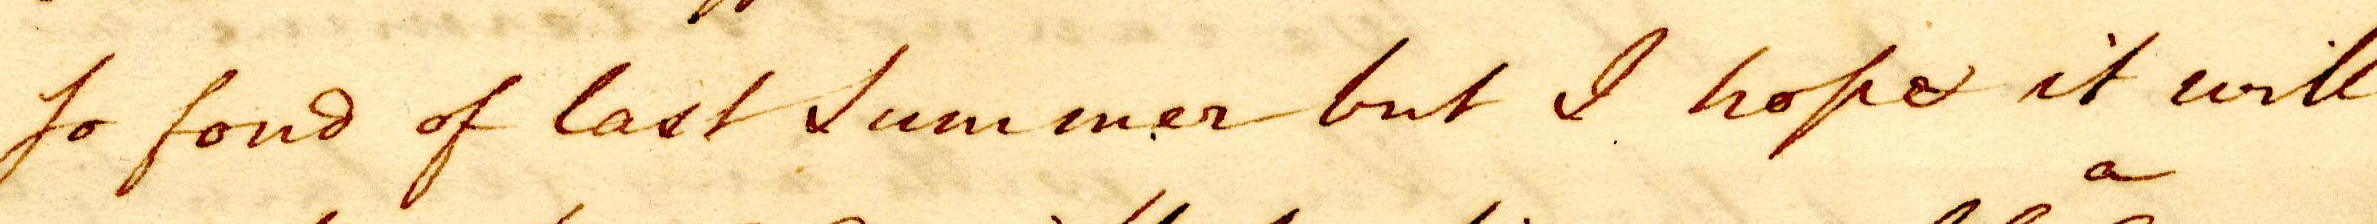to fond of last Summer but I hope it will
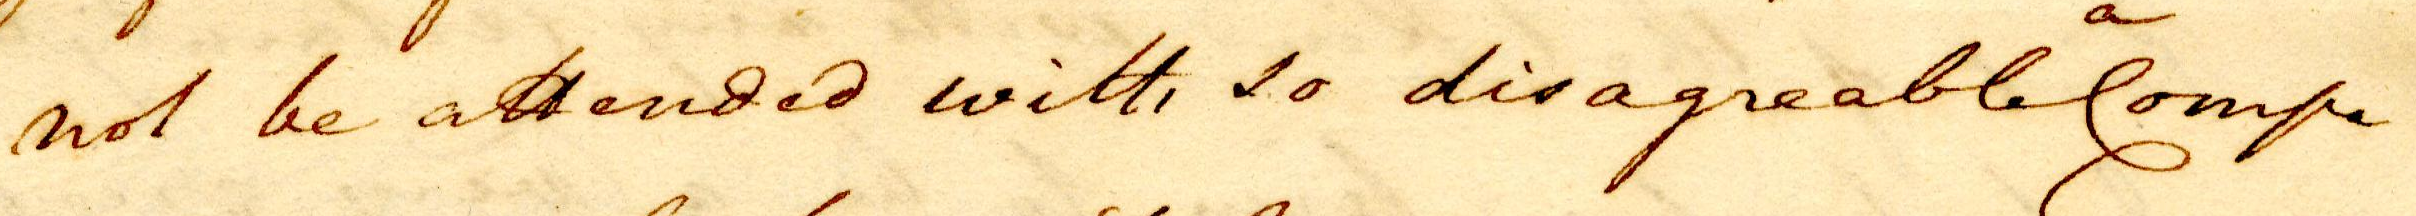not be attended with so disagreable Compa-
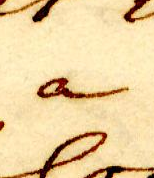a
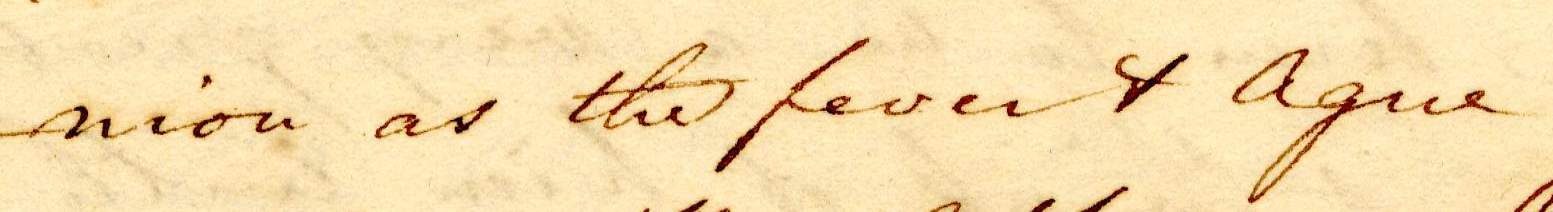-nion as the fever & Ague
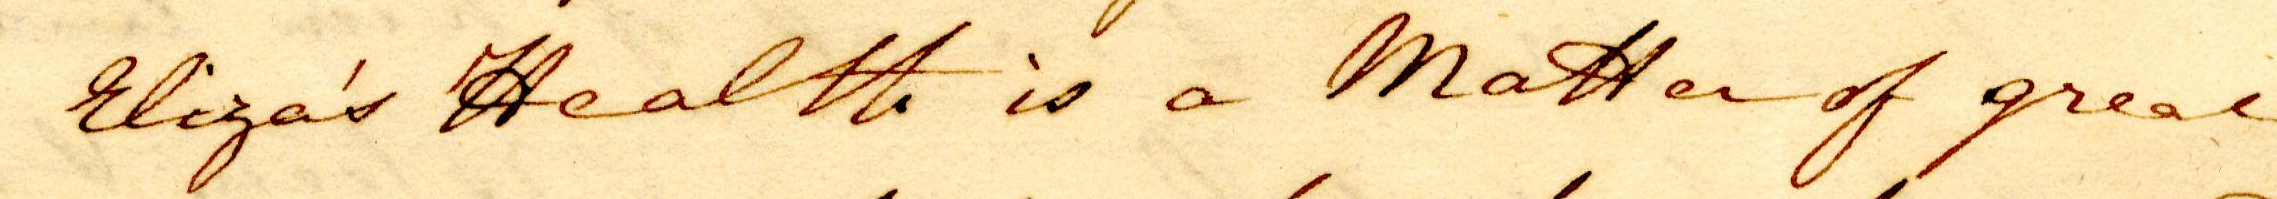Eliza's Health is a Matter of great
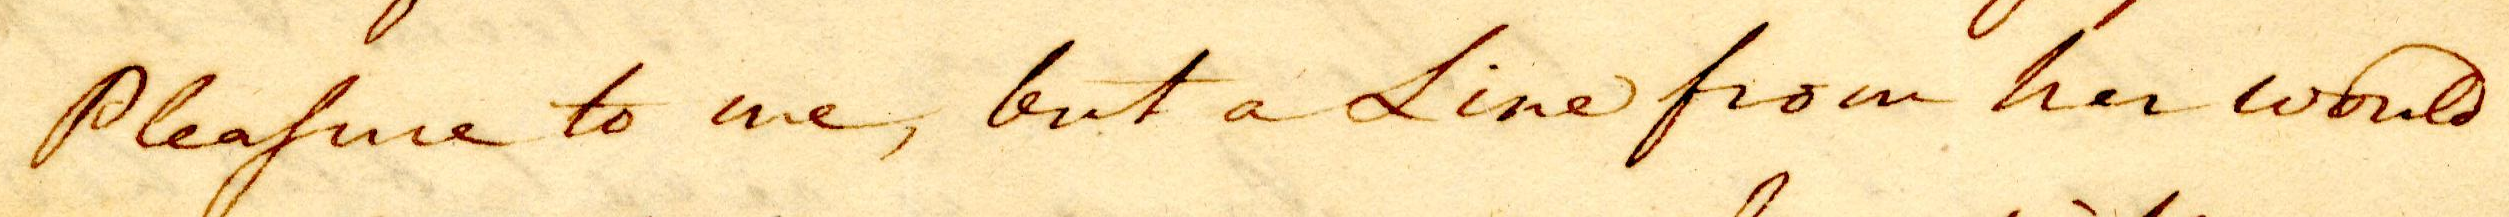Pleasure to me, but a Line from her would
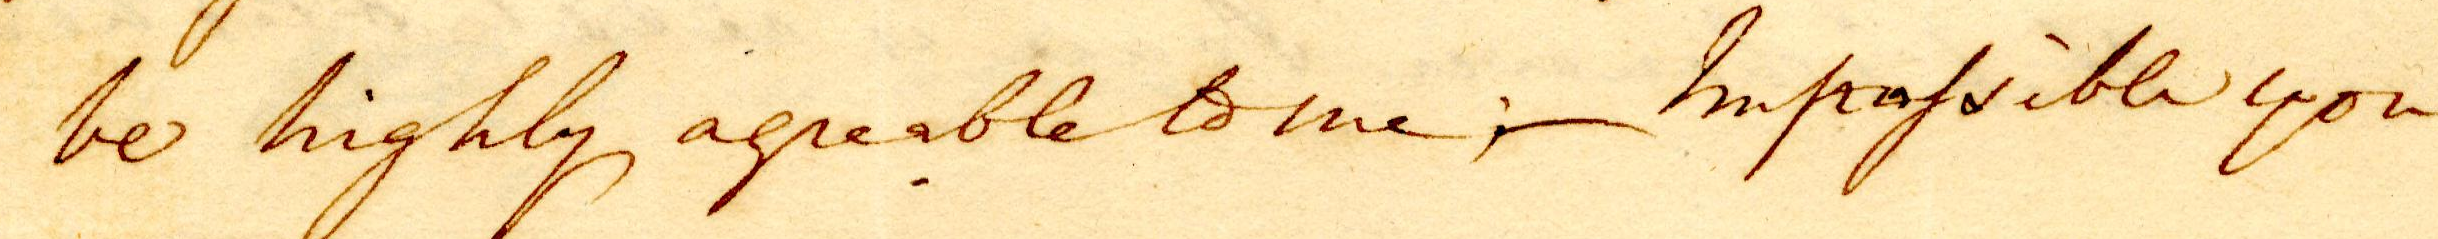be highly agreable to me; Impossible you
